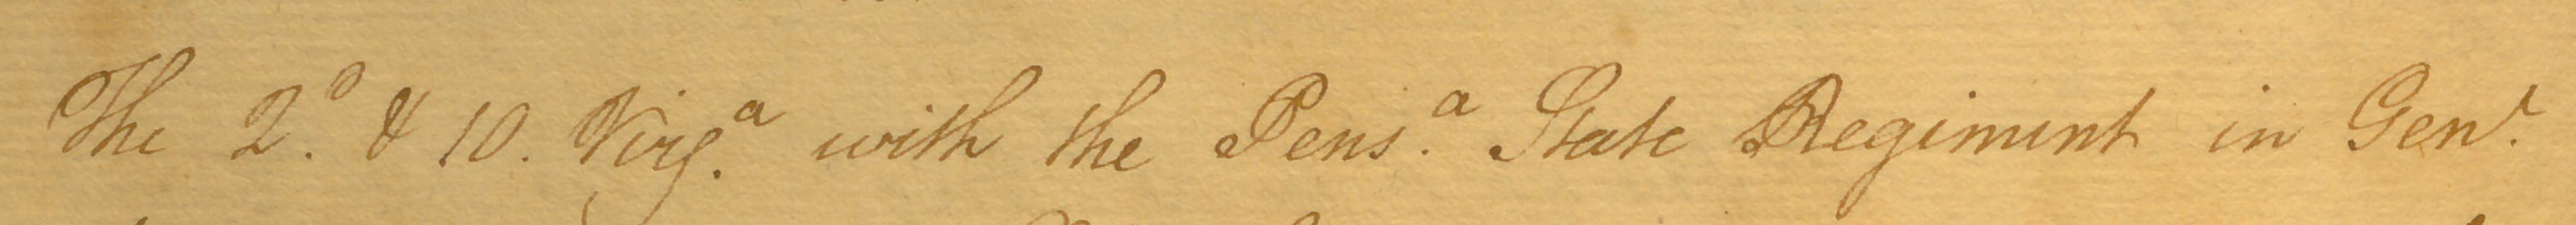The 2^d. & 10. Virg^a. with the Pens^a. State Regiment in Gen^l.
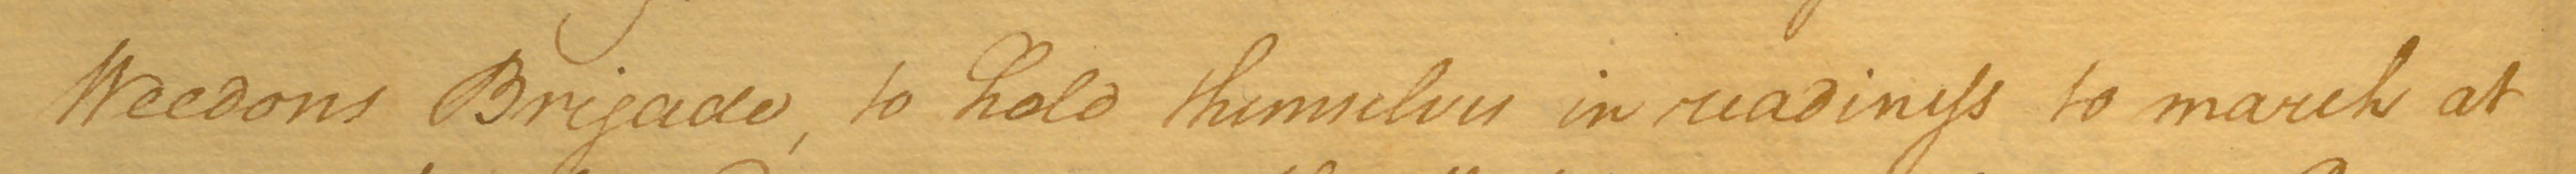Weedons Brigade, to hold themselves in readiness to march at
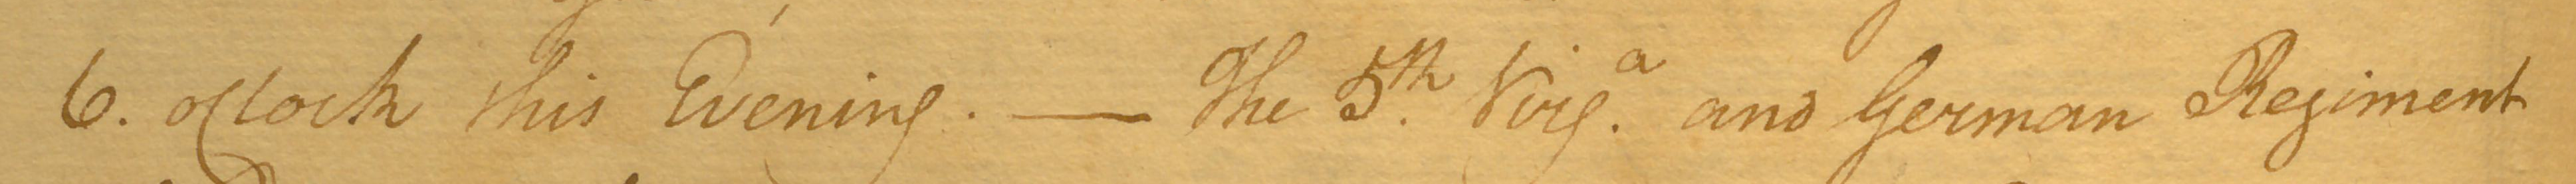6. oClock this Evening.- The 5^th. Virg^a. and German Regiment
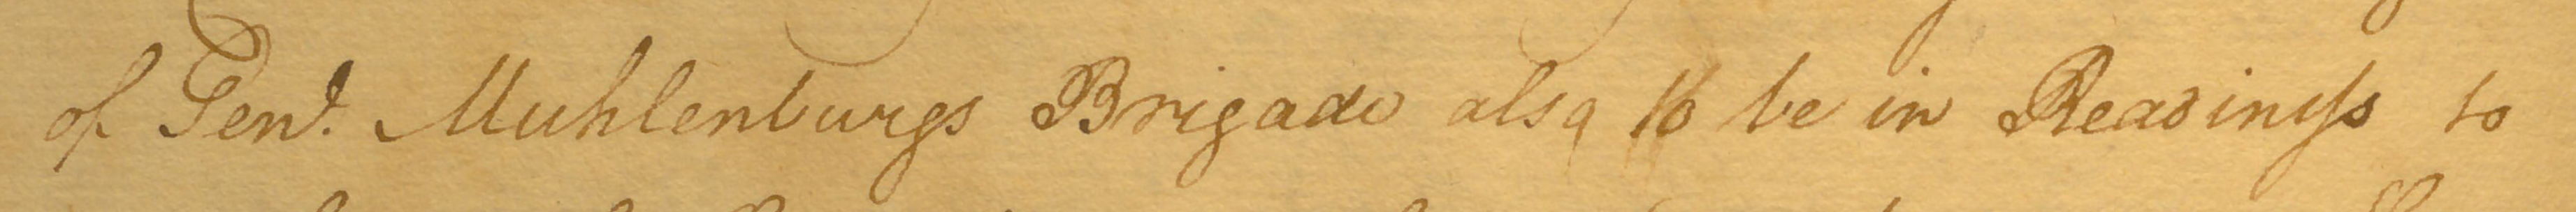of Gen^l. Muhlenburgs Brigade also to be in Readiness to
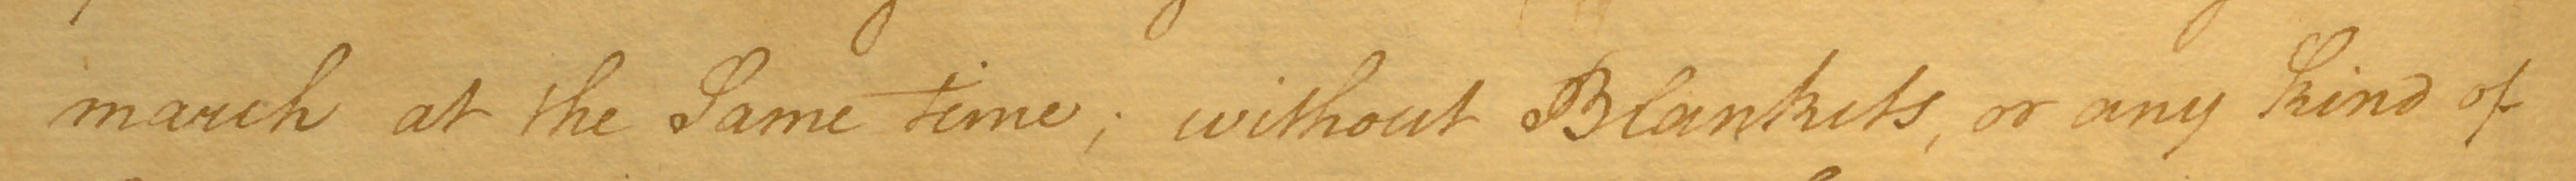march at the Same time; without Blankets, or any kind of
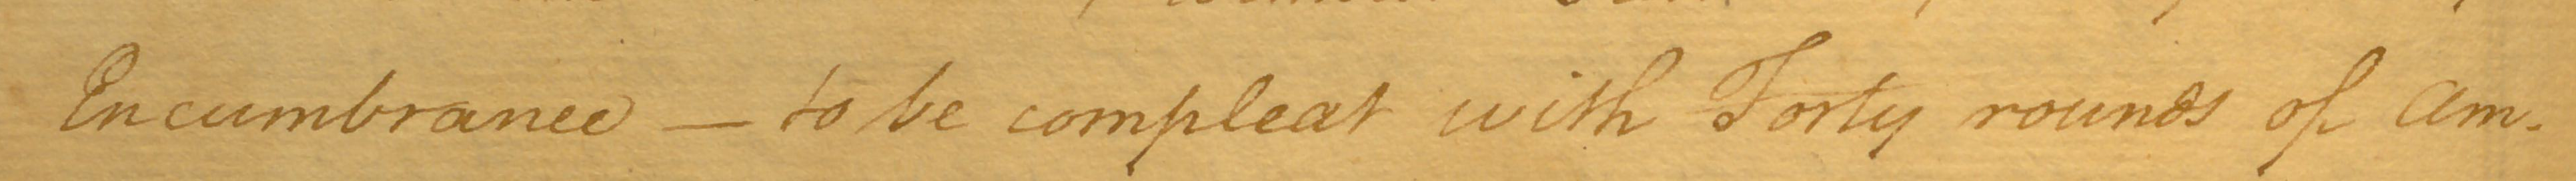Encumbrance- to be compleat with Forty rounds of am-
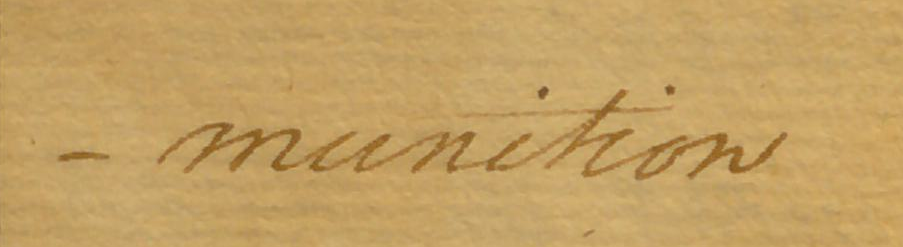-munition
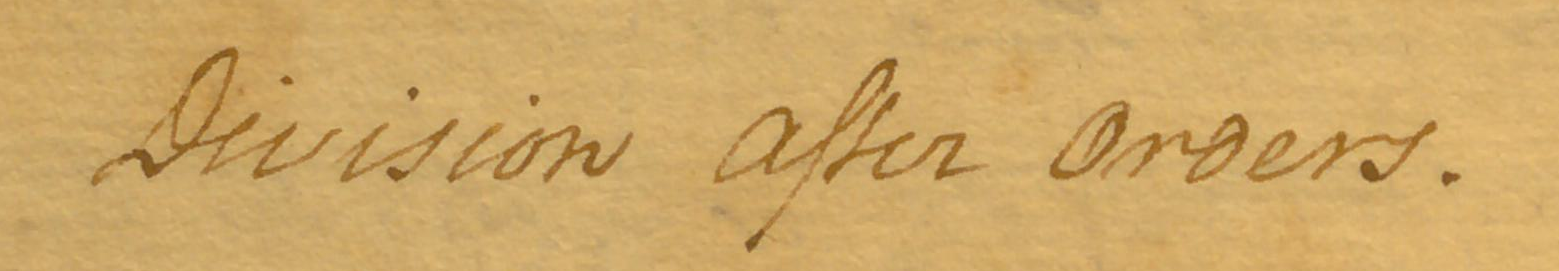Division after orders.
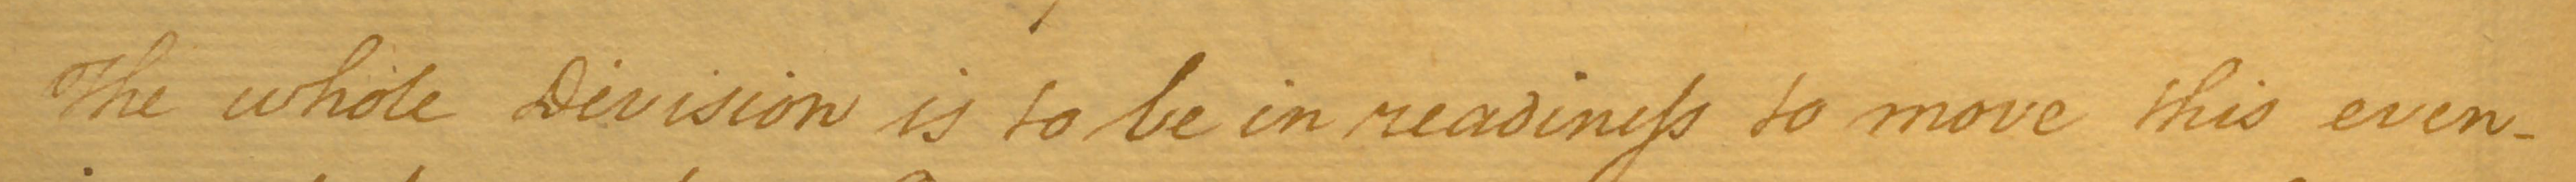The whole Division is to be in readiness to move this even-
